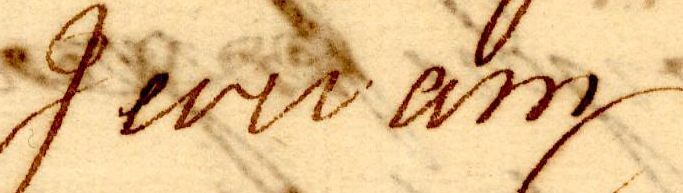I ever am
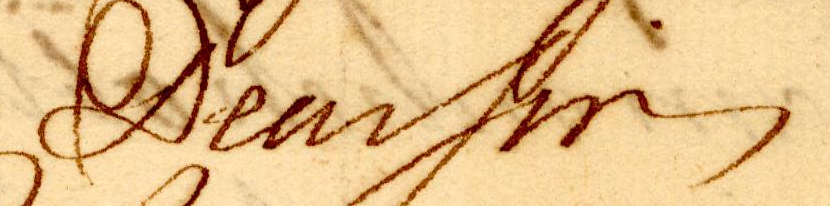Dear Sir
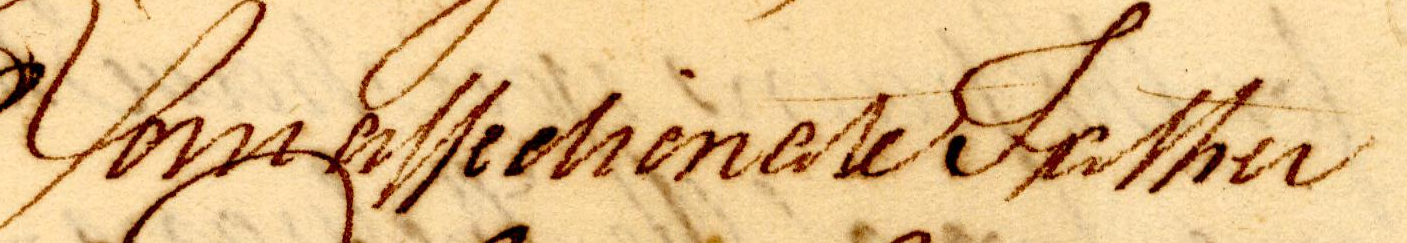Your affectionate Father
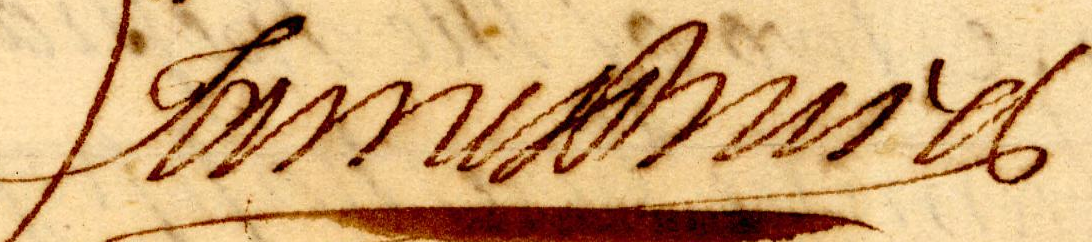James Burd
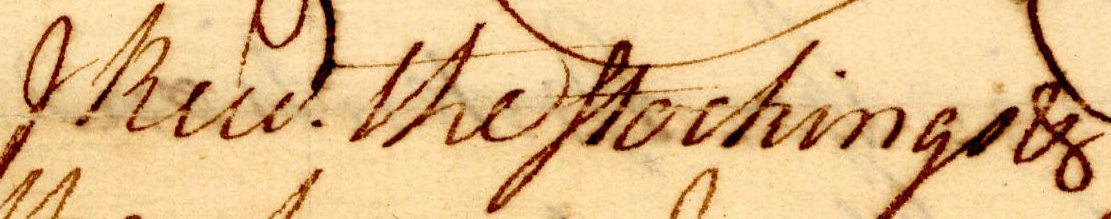I Recd. the Stockings &
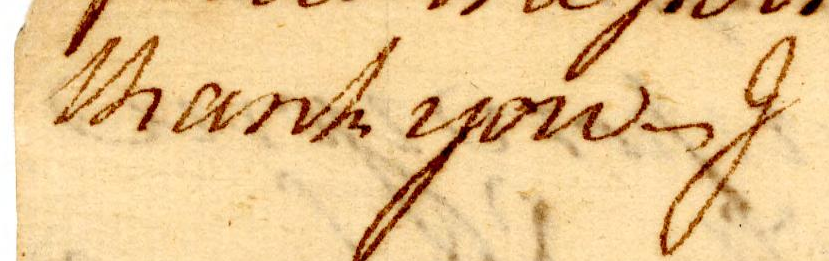thank you- J
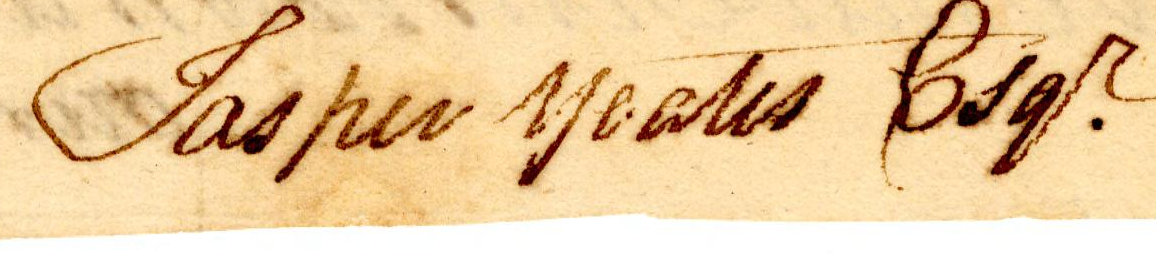Jasper Yeates Esq^r.
